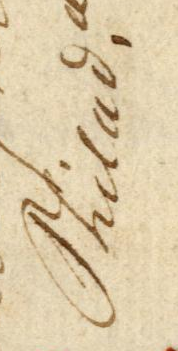Philad^a
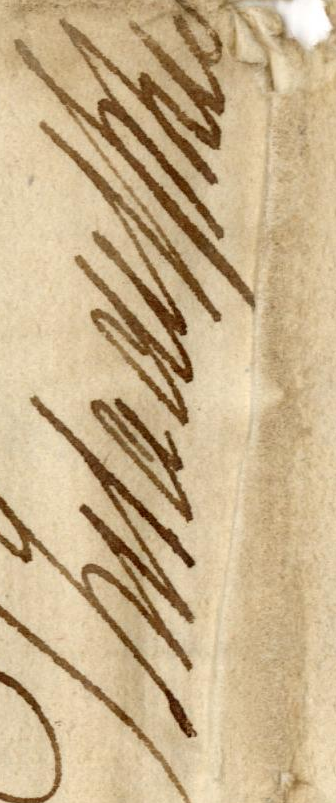Philadelphia
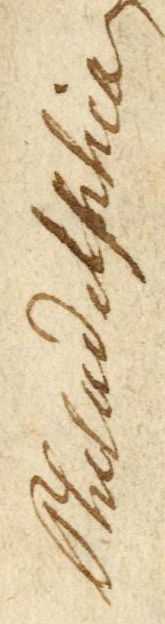Philadelphia
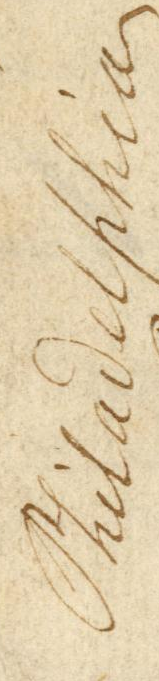Philadelphia
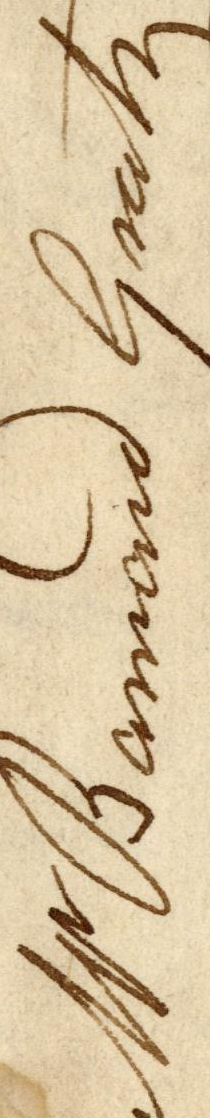M^r Barnard Gratz
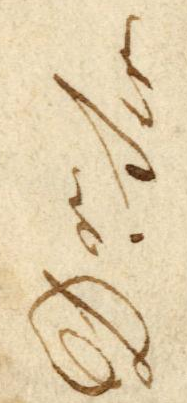D^r Sir
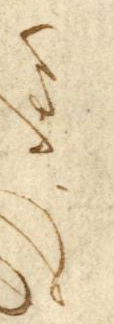D^r Sir
